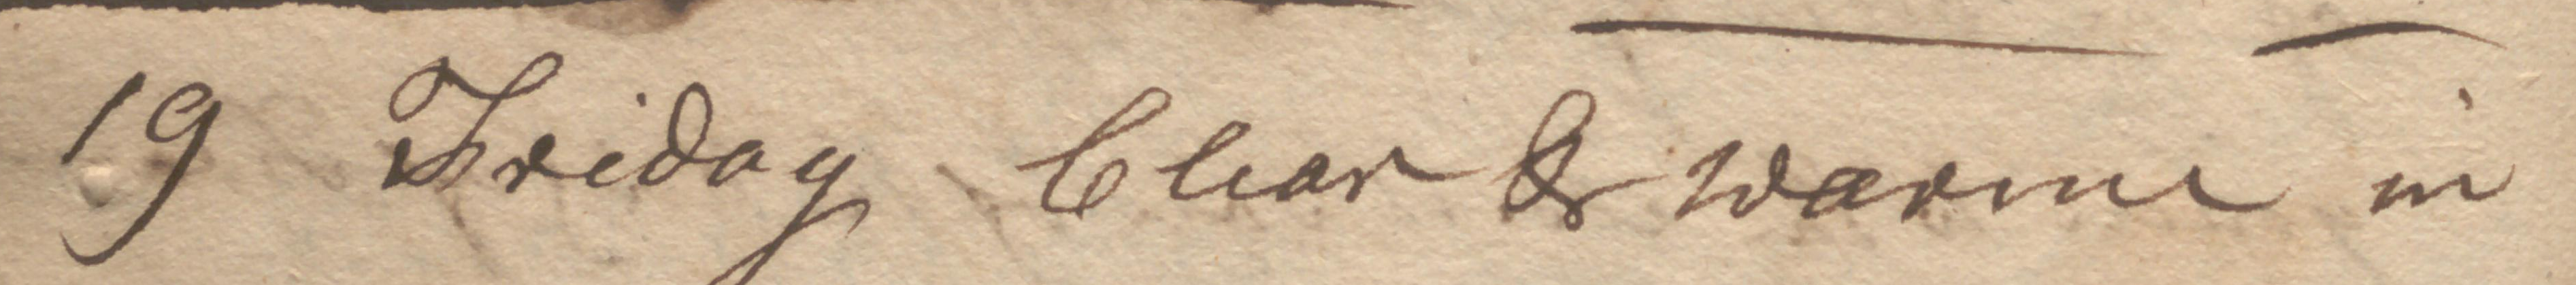19 Friday. Clear & warme in
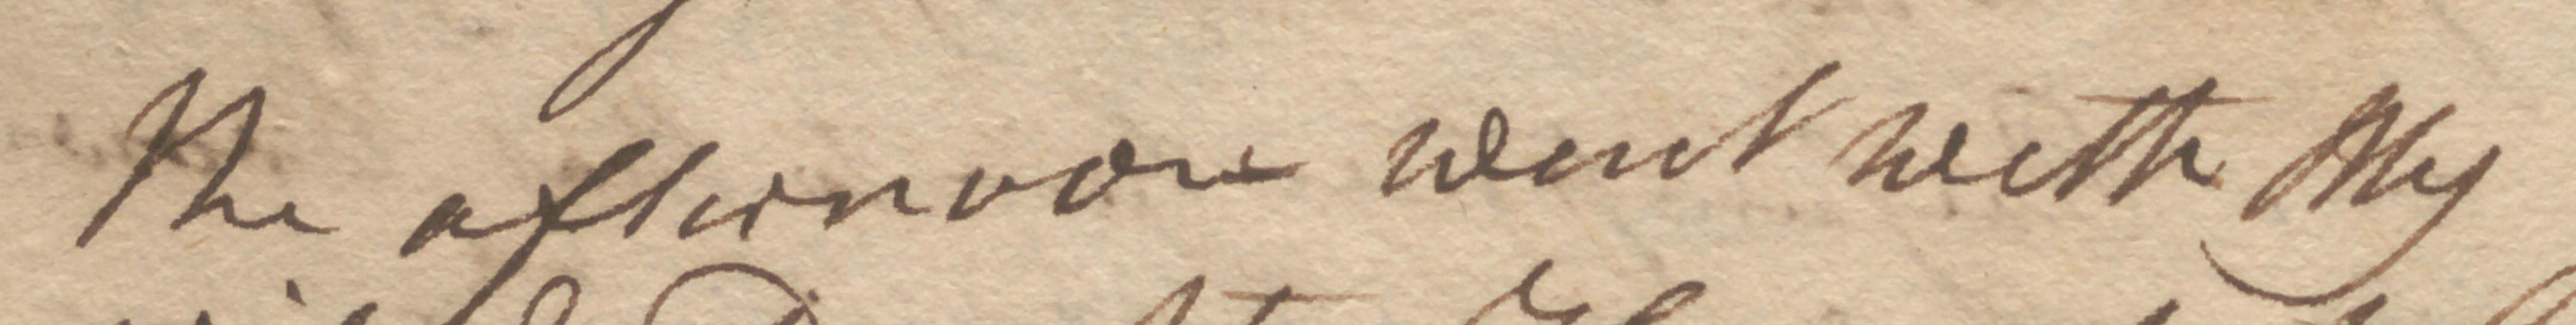the afternoon went with My
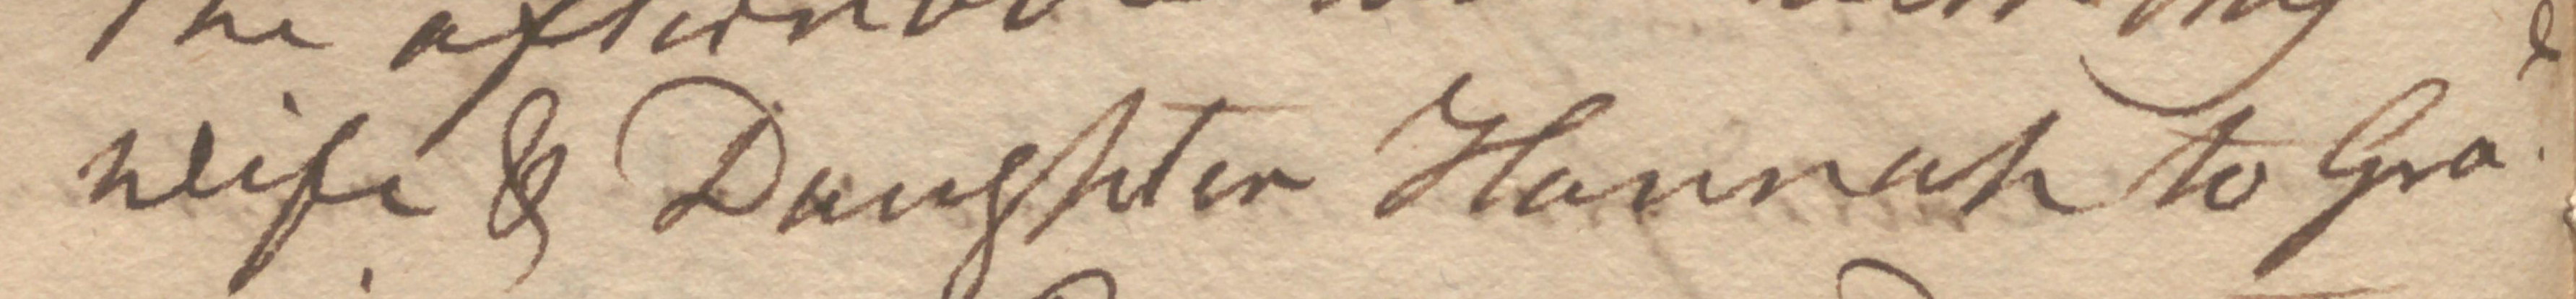wife & Daughter Hannah to Gra^l.
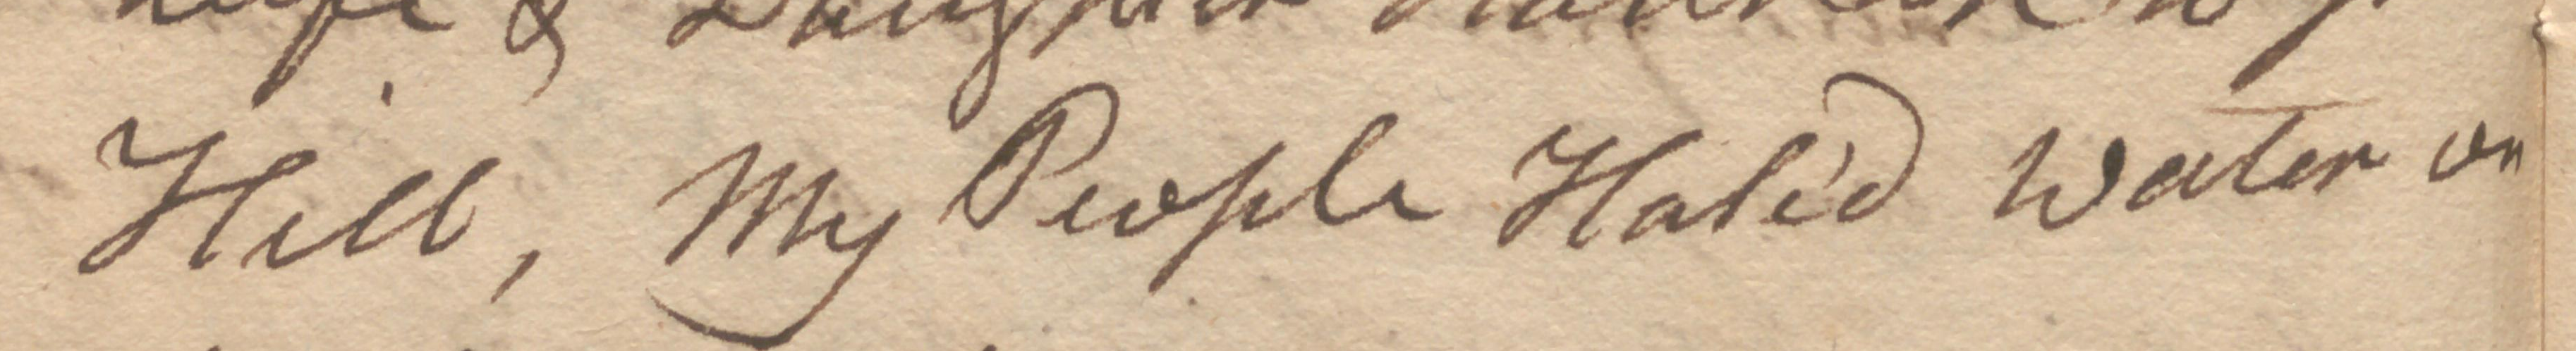Hill, My People Hale'd Water on
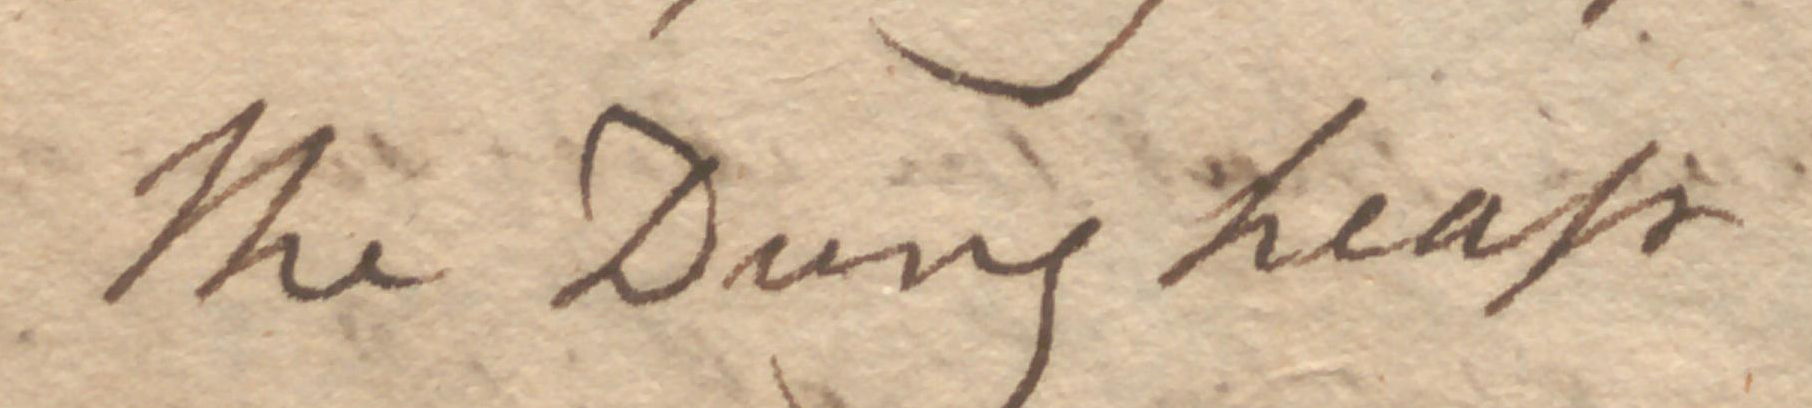the Dung heap
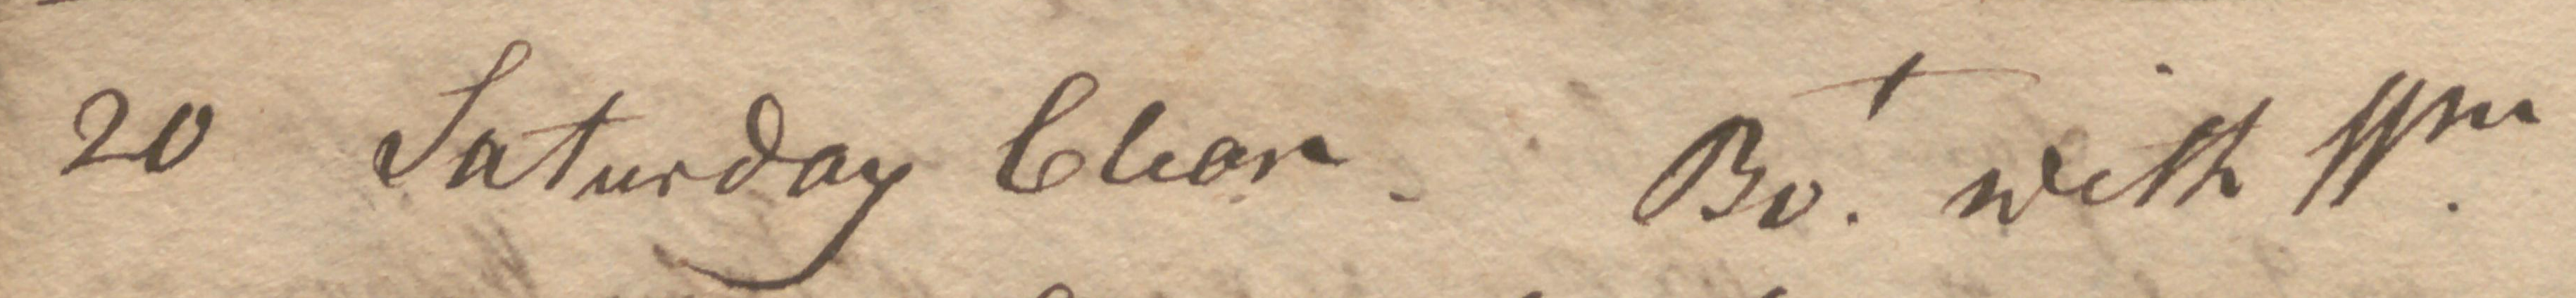20 Saturday Clear. Bo^t. with W^m.
